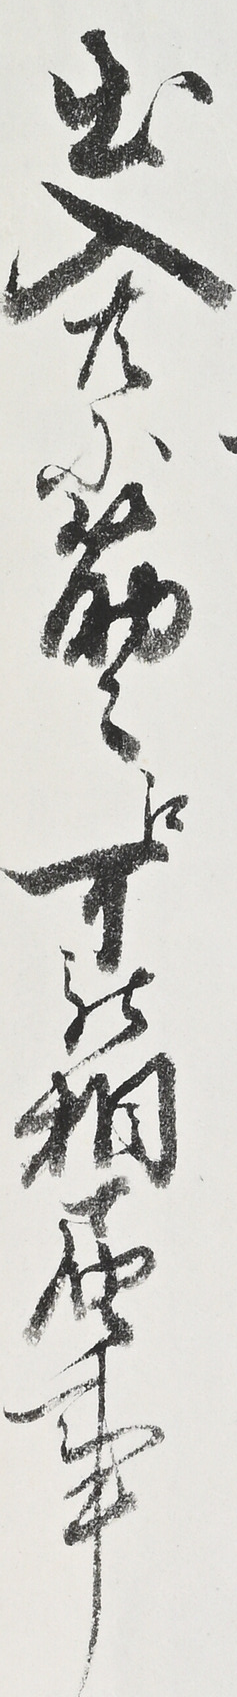出入共に筋々江可被相届事
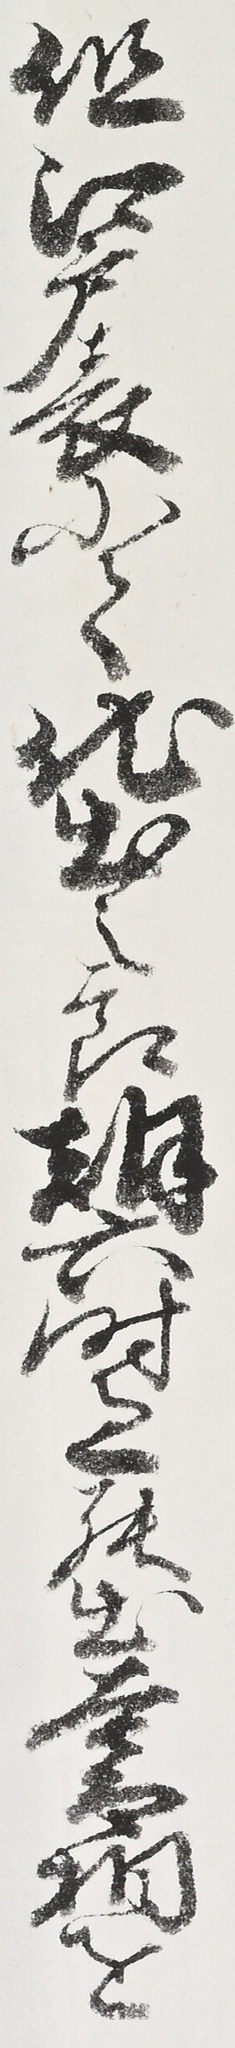但江戸表にて他出之節朝六時過罷出暮相を
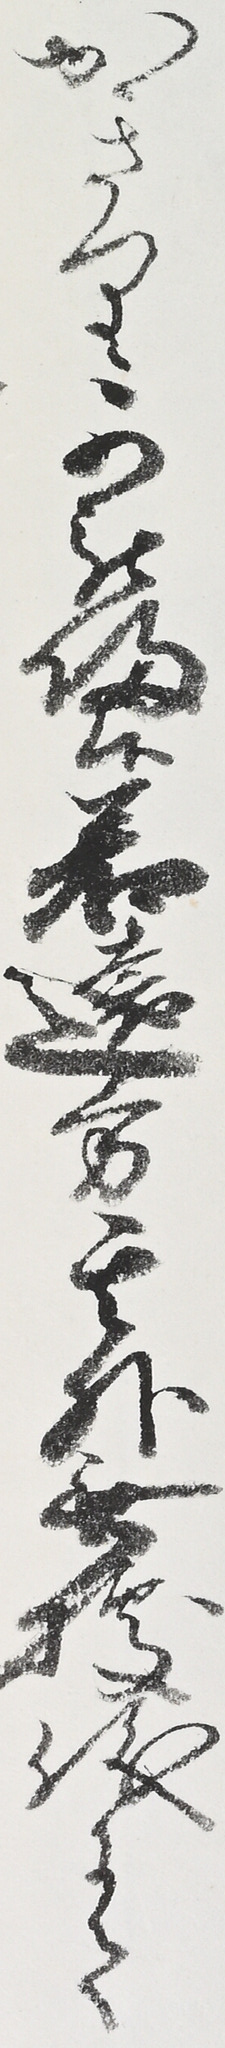かきり可被帰候若遠方其外無拠儀にて
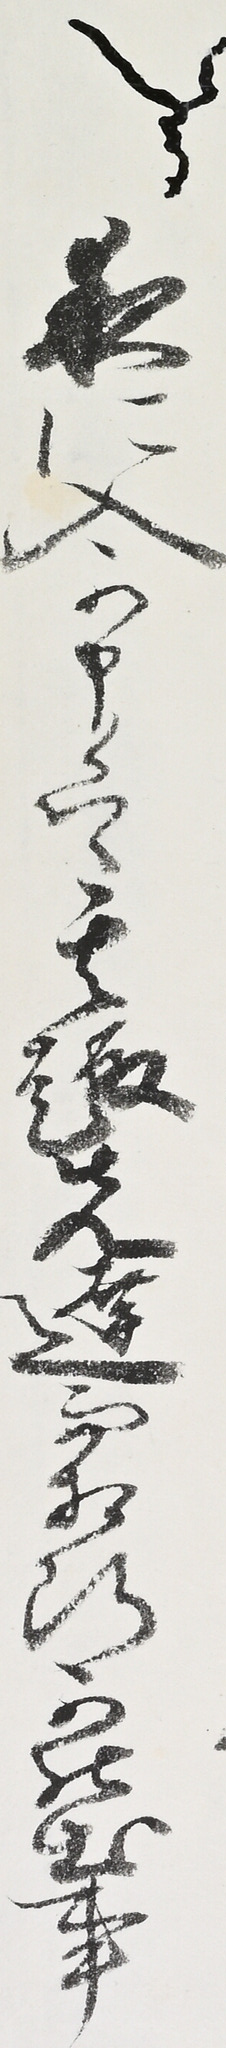夜に入可申候ハゝ其趣先達而相断可被出事
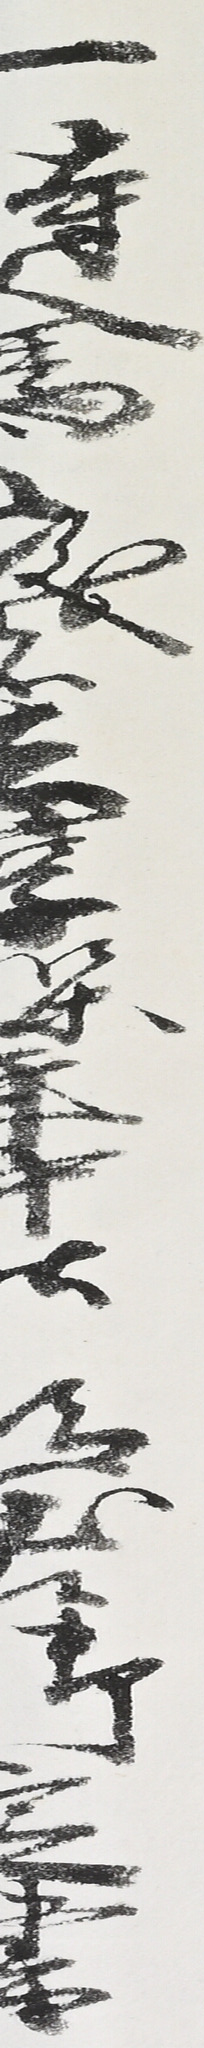一持人馬之儀者申去享保年中被仰出候御定書

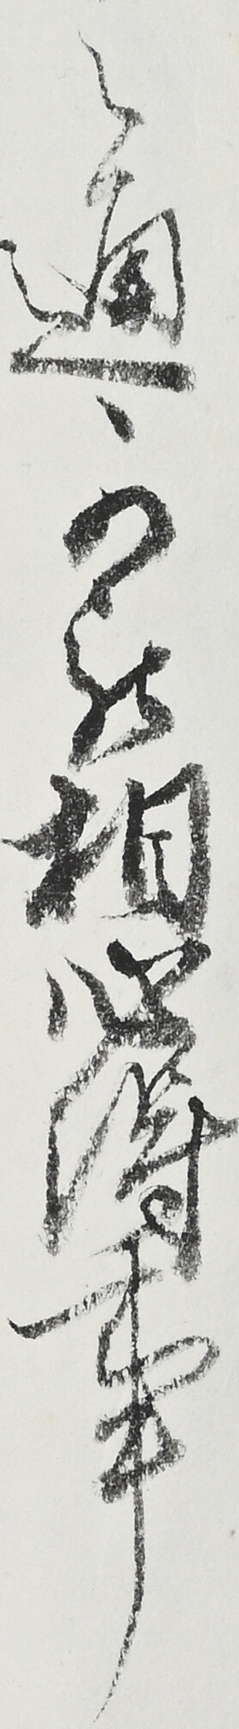之通可被相心得事
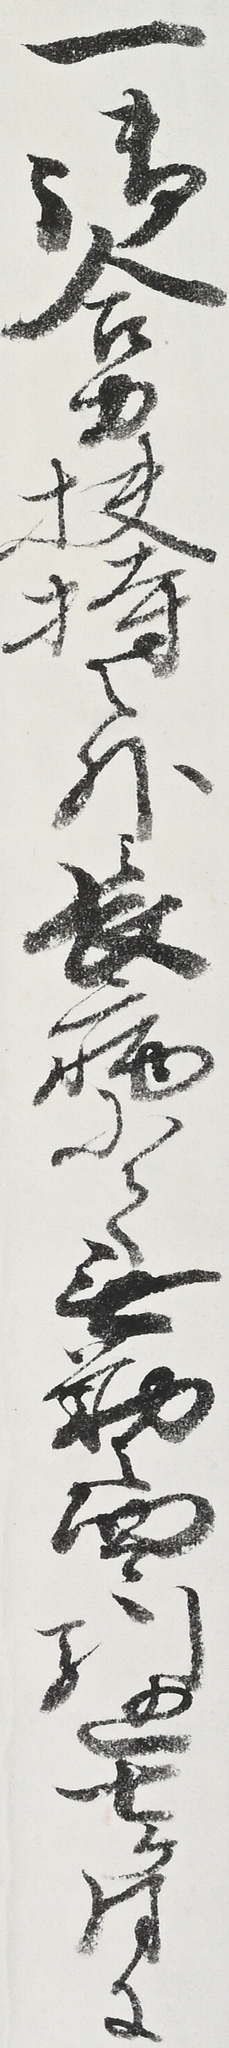一御合力扶持之外長病にて無勤之面々引込七ケ月に
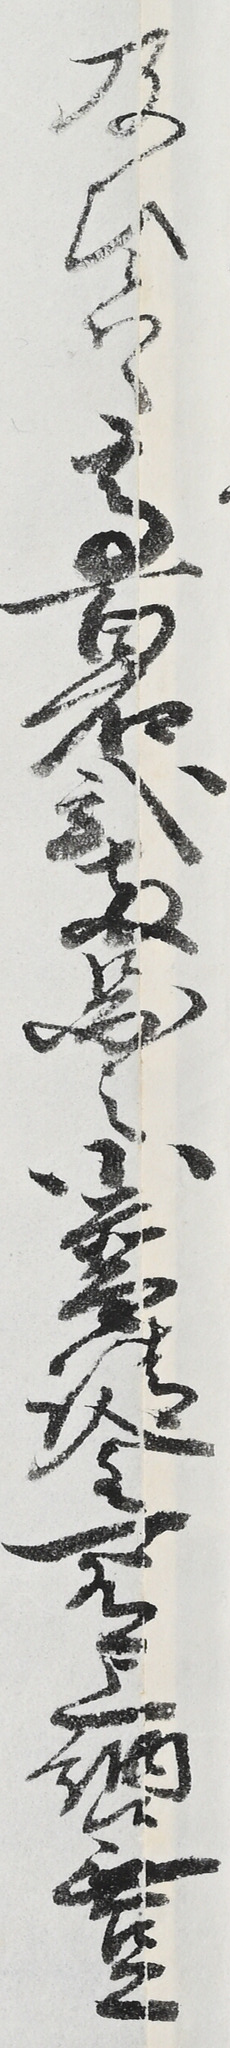及ひ候ハゝ高百石弐両図之小普請金可有上納候無足
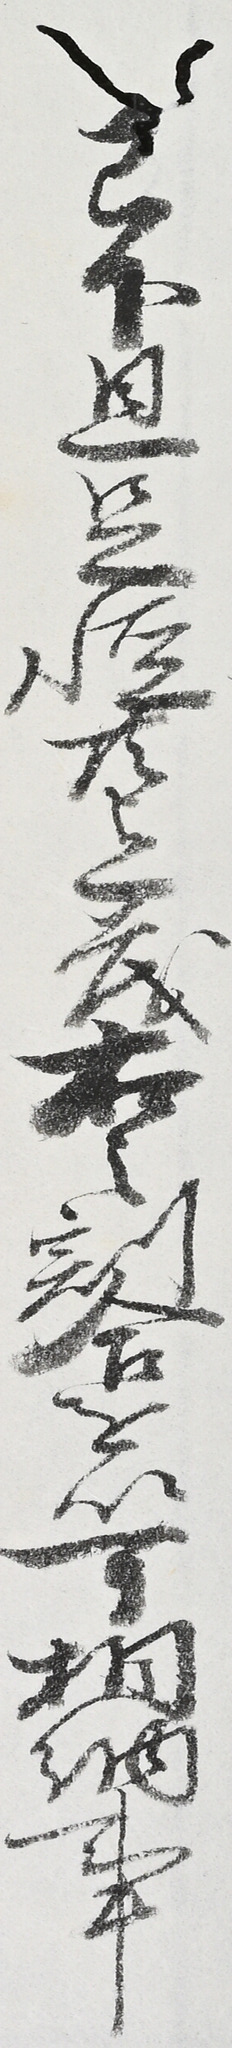已下且足軽共迄茂み右之割合を以可相納事
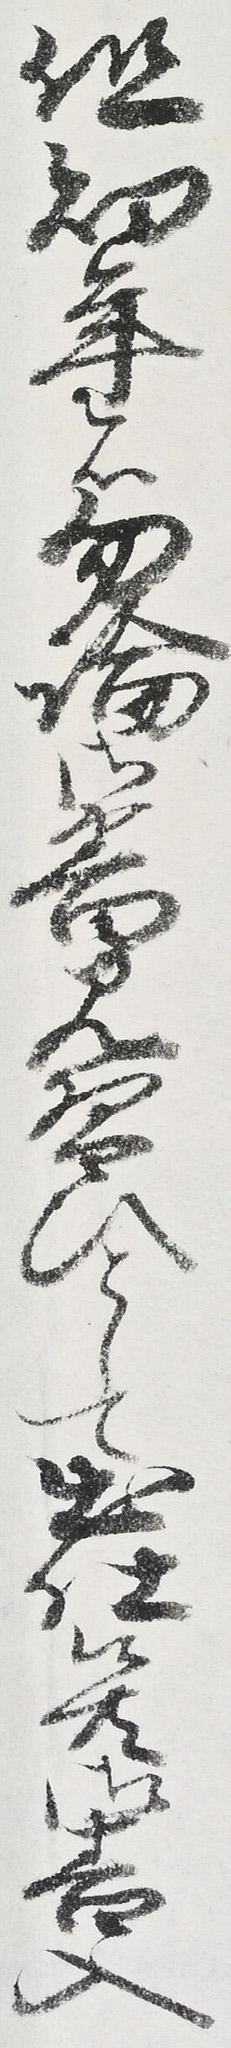但幼年者勿論御番見習ひとして出仕候共御番入
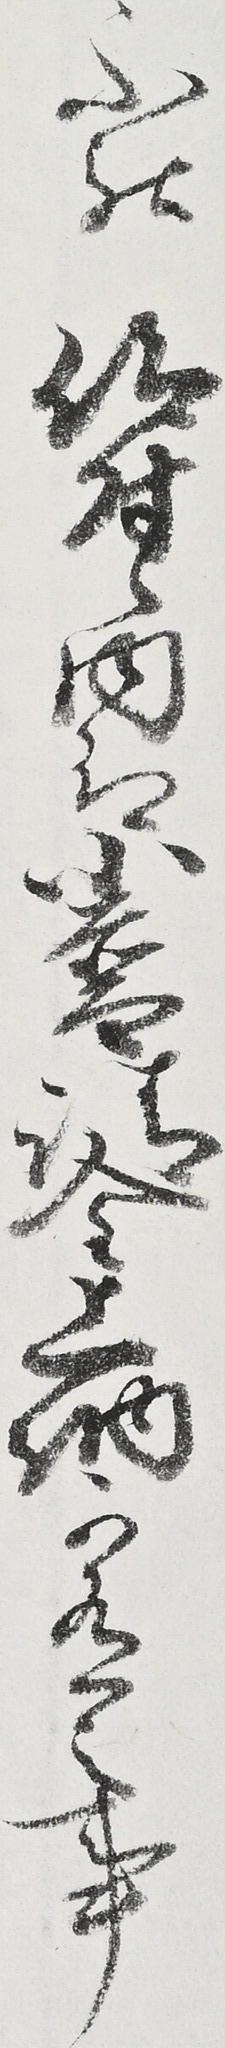不被仰付候内は小普請金上納可有之事
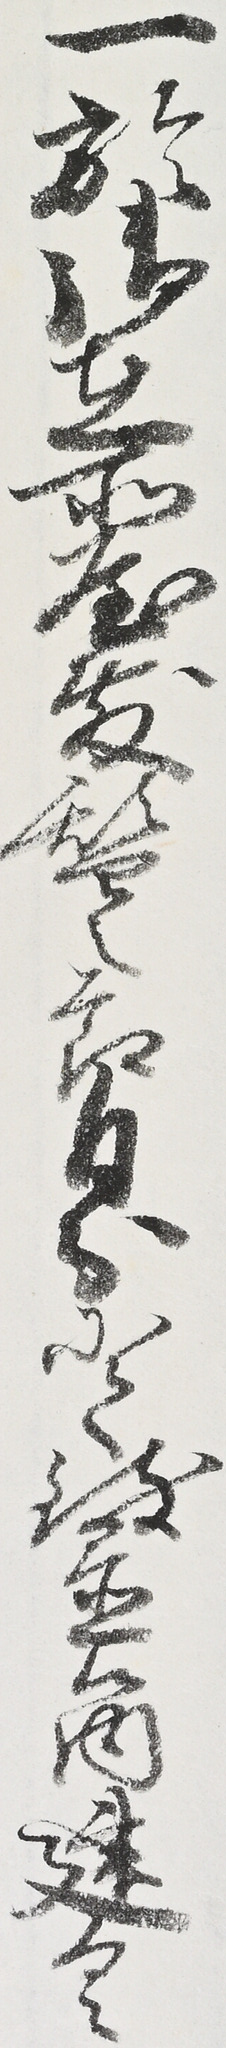一於御在所屋敷替之節自分にて致置候内建具
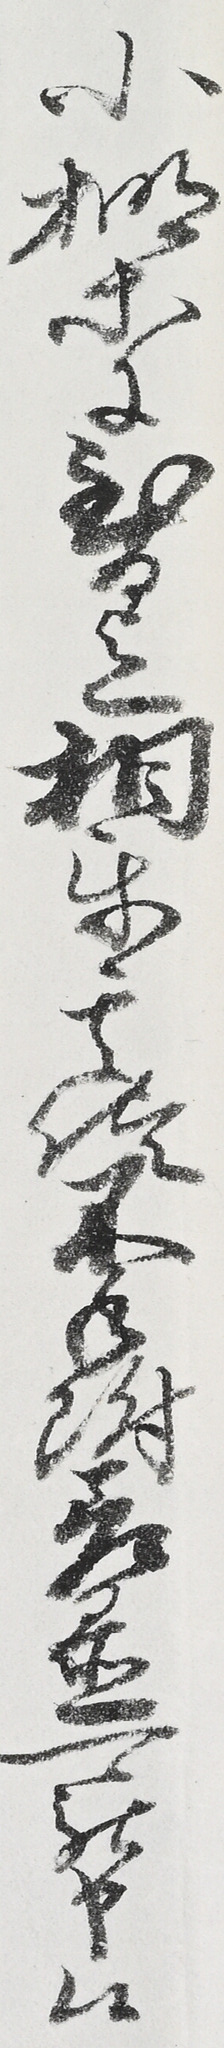小棚等に至る迄相互其侭不手附差置可被申候
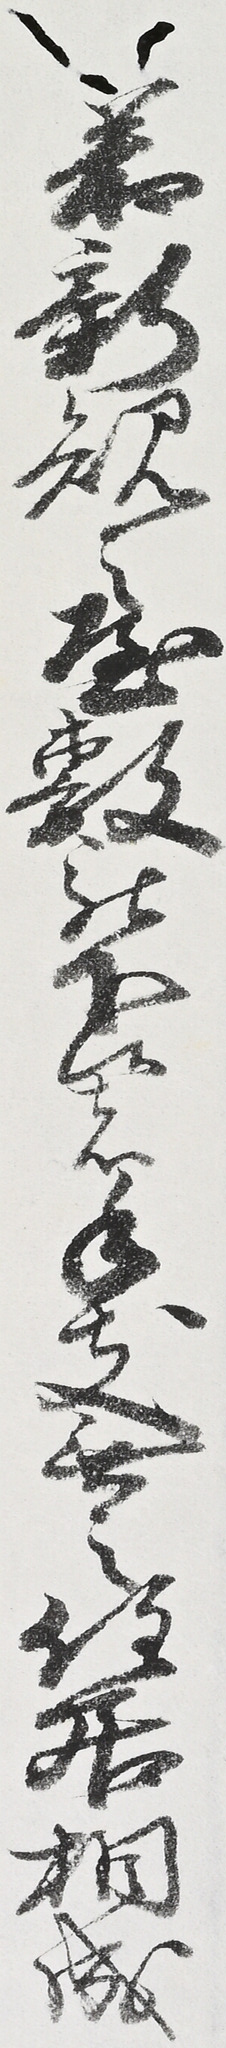若新規之屋敷被下候者手支無之住居相成
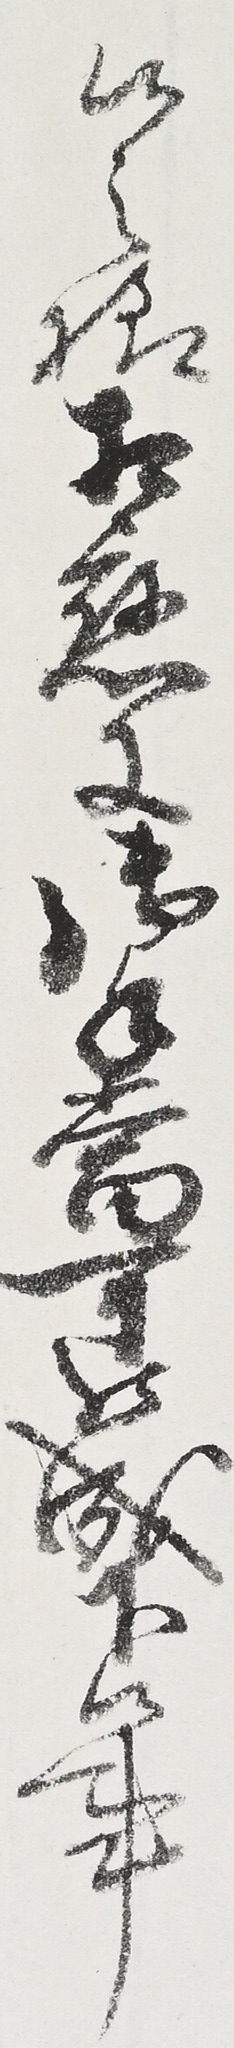候之様相応に御手当可被成下候事
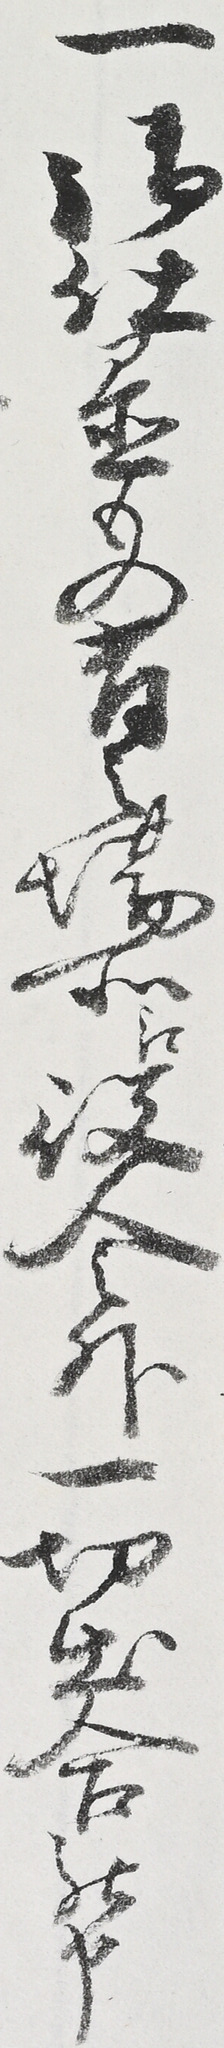一御仕置もの有之場所江役人之外一切出合被申
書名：仰書覚〔写共二通一括〕
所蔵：伊那市立高遠町図書館・合同会社AMANE
